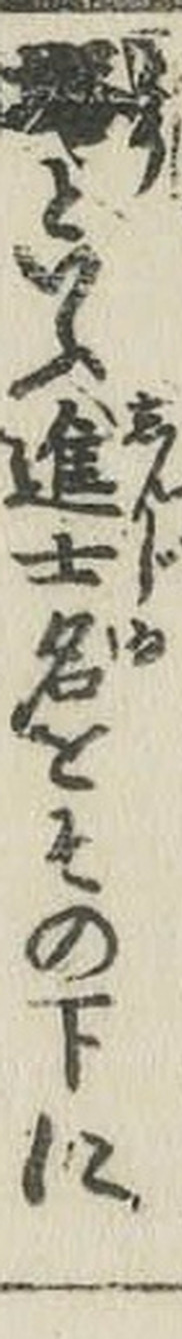塔といふ進士名をその下に
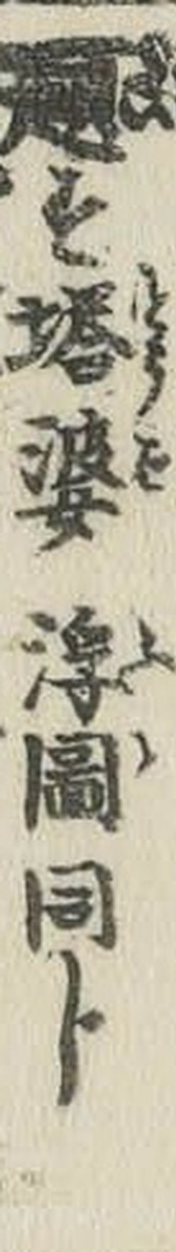題す塔婆浮図同じ
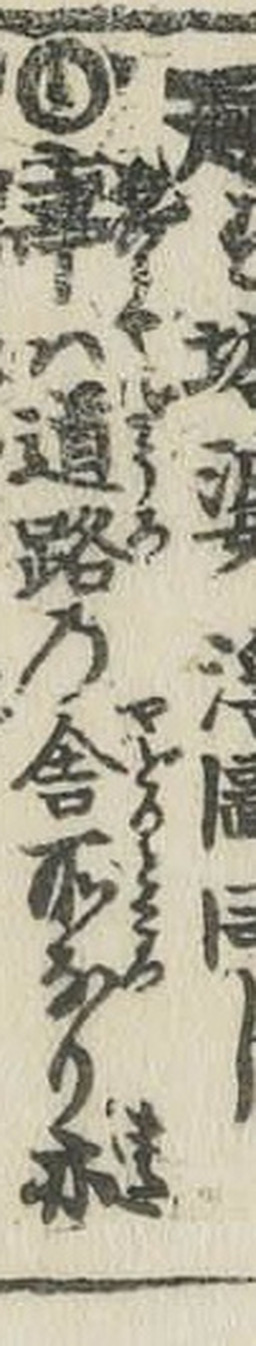○亭は道路の舎所なり亦
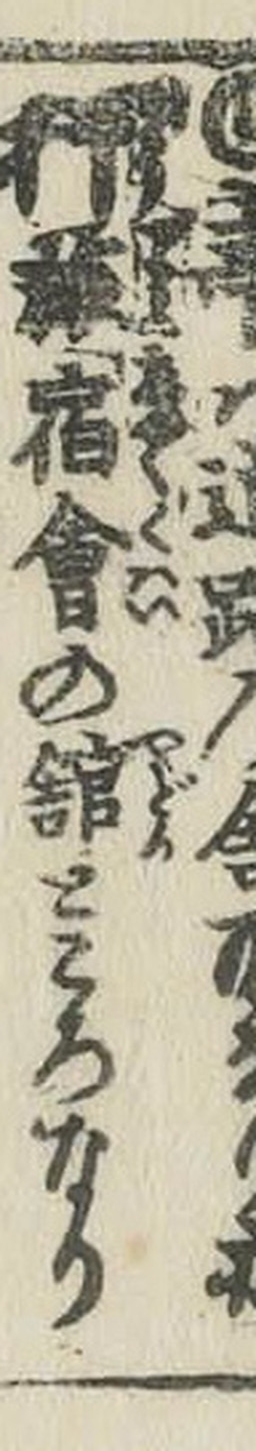行旅宿会の館ところなり
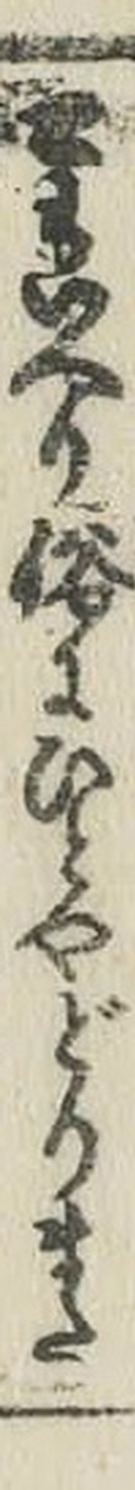ともいへり俗にひとやどりまた
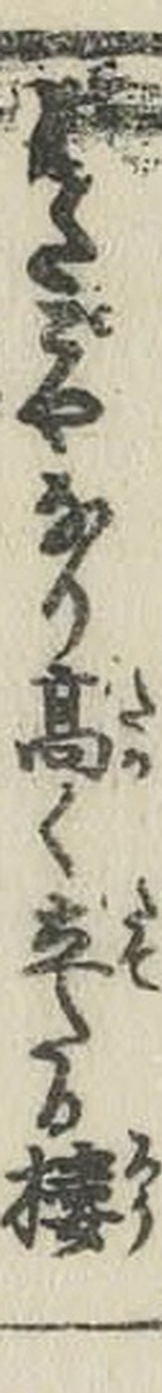はたごやなり高く立たる楼
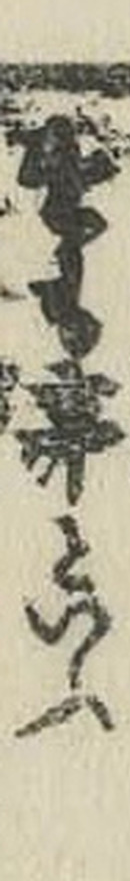をも亭といふ
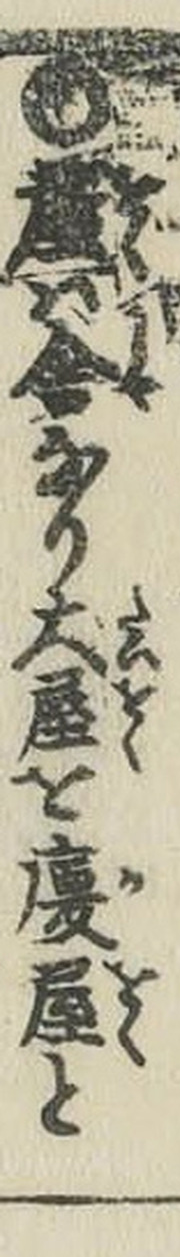○屋は舎なり大屋を廈屋と
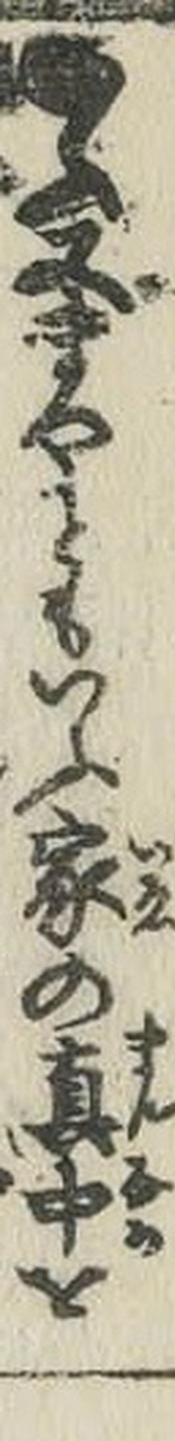いふ又まやともいふ家の真中を
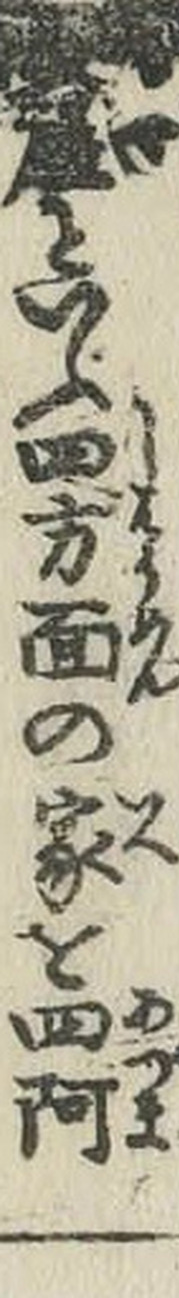母屋といふ四方面の家を四阿
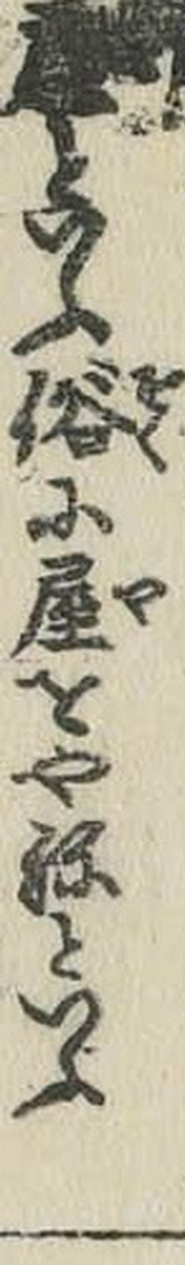屋といふ俗に屋をやねといふ
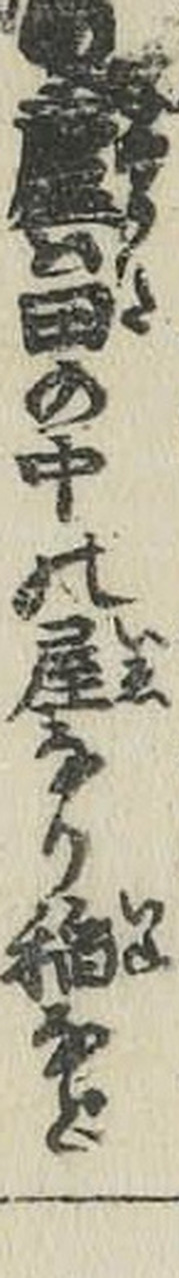○廬は田の中の屋なり稲など
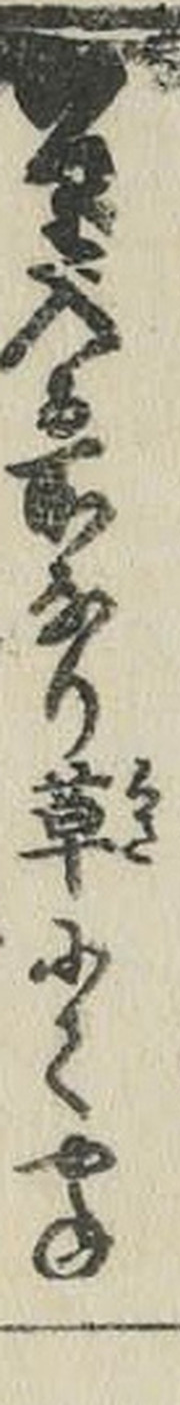かり入る所なり草にてやね
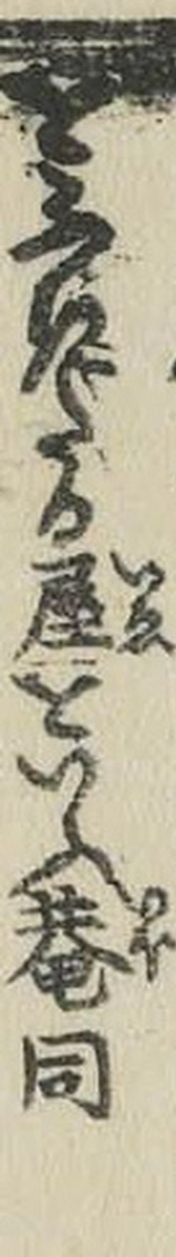をふきたる屋をいふ菴同
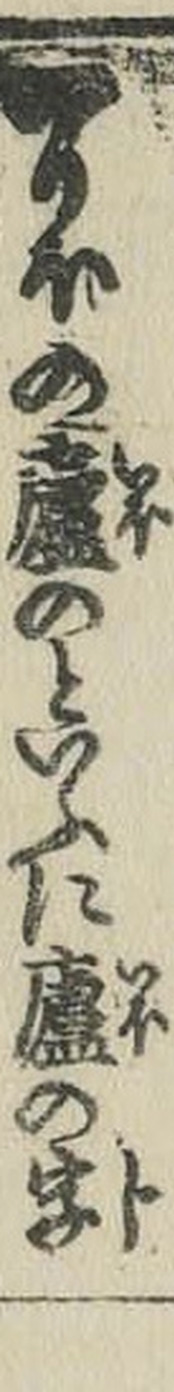かりほの廬のといふに廬の字

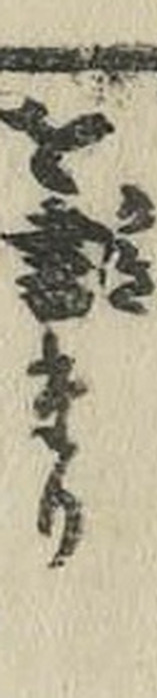を書たり
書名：増補頭書訓蒙図彙大成 10巻 2:巻之1-3
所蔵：東京学芸大学教育コンテンツアーカイブ
